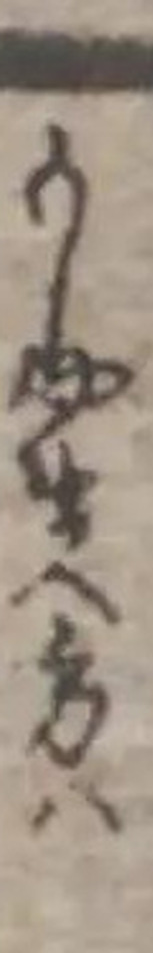もしおまへ方は
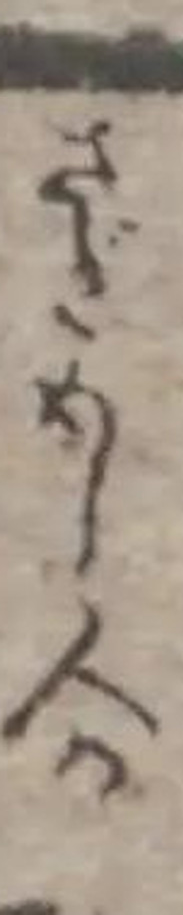さだめし人か
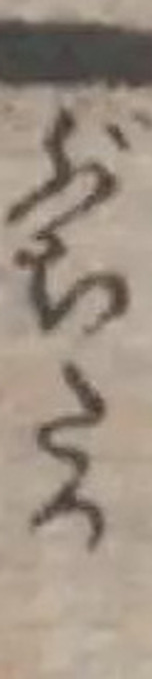ぶちたか
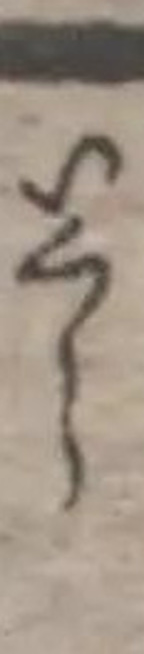いくら
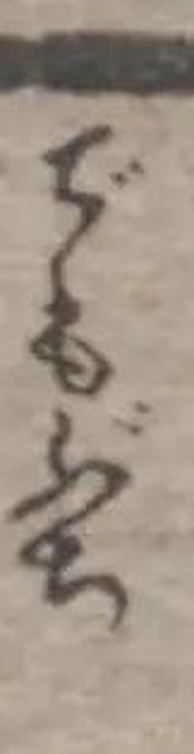でもぶち
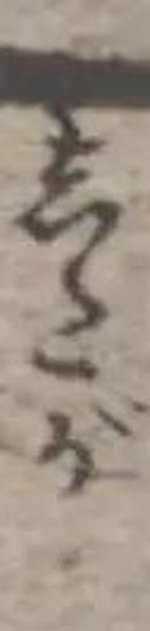したが
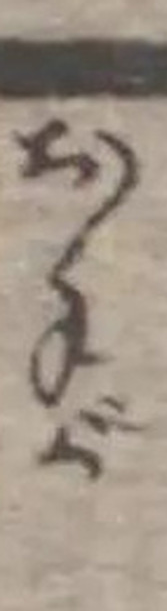お手が
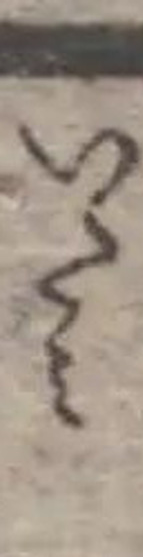いたみ
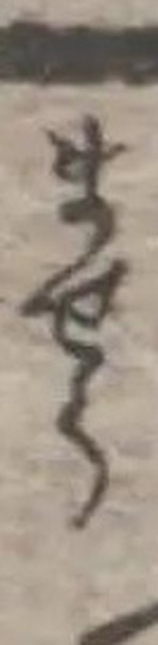ませう
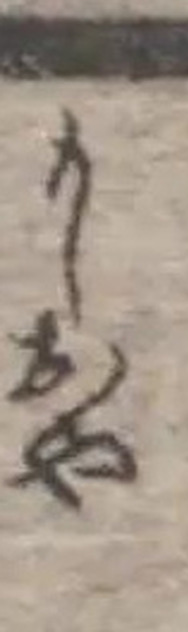もしおや
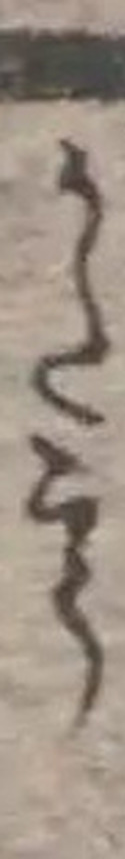かたこう
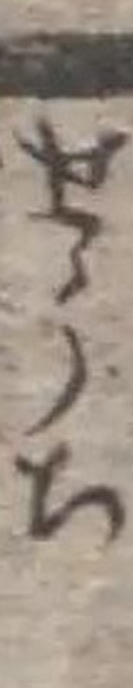せうち
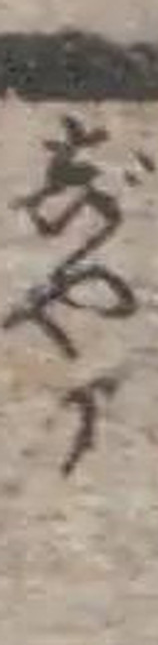じやア
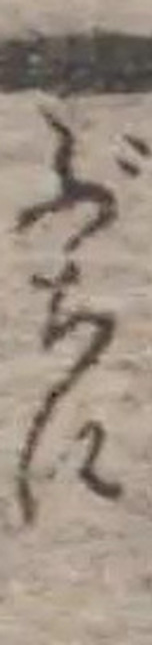ぶちに
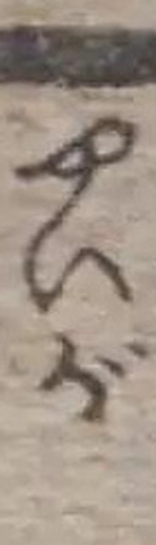やいが

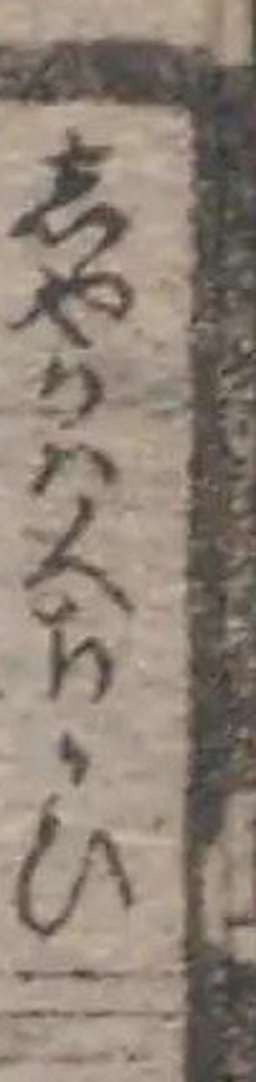しやかは人ちかひ
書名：早出来 3巻
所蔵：国立国会図書館 National Diet Library, JAPAN
